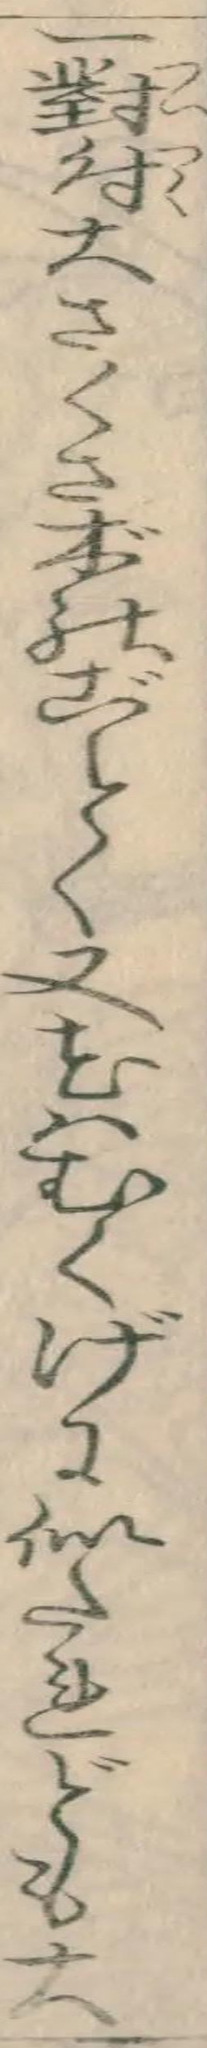一對付大さくさぎのごとく又花はむくげに似たれども大
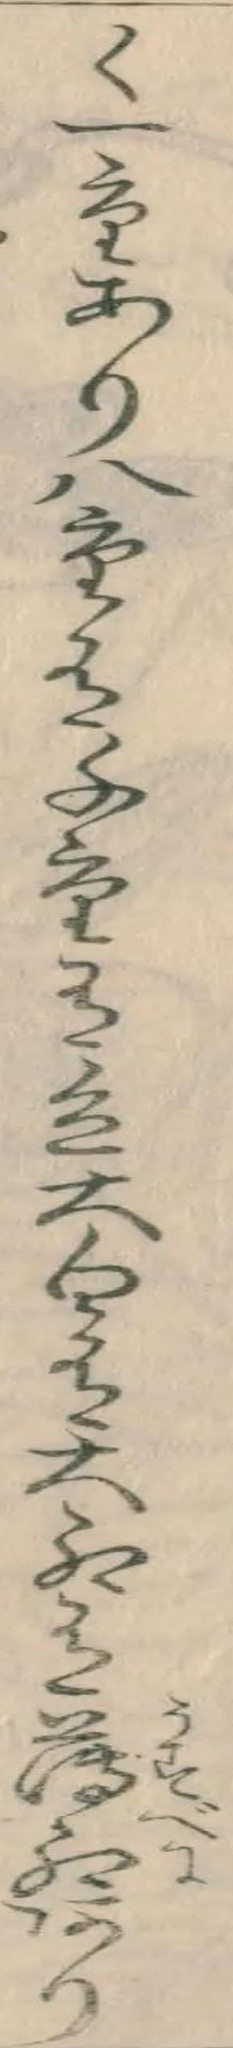く一重あり八重有千重有色大白有大紅有薄紅あり
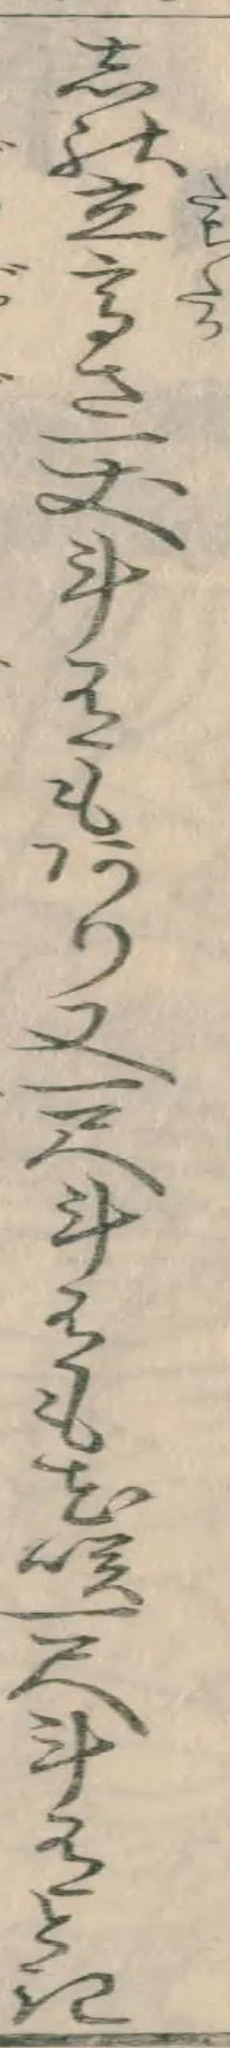しの立高さ一丈斗有もあり又一尺斗有も花咲一尺斗有とき
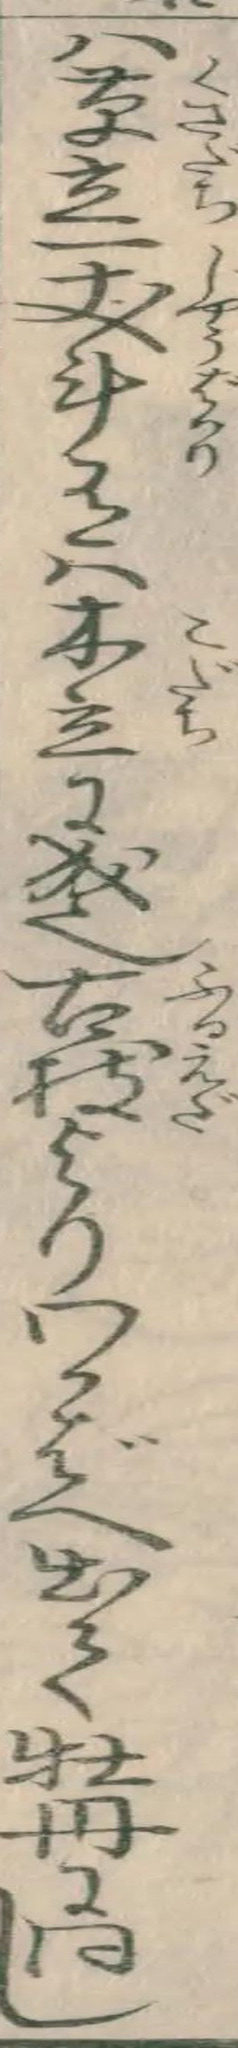は草立一丈斗有は木立に成也古枝よりわかばへ出て牡丹に同し
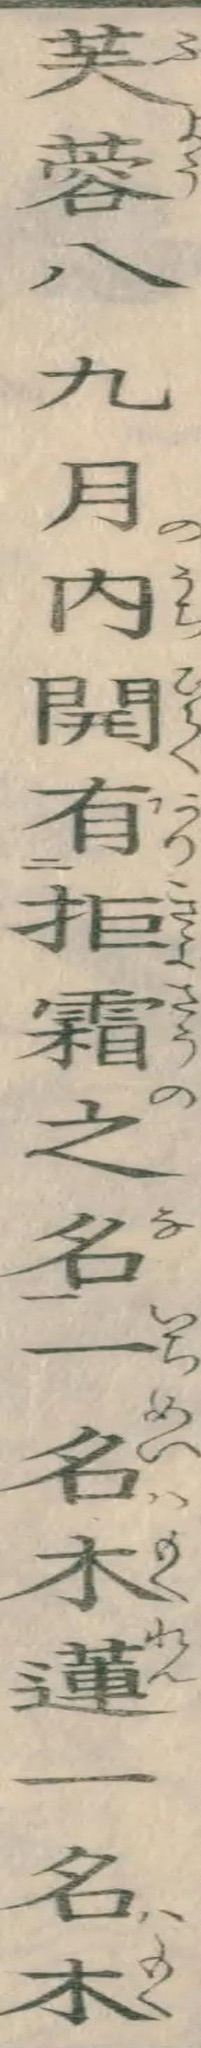芙蓉八九月内開有拒霜之名一名木蓮一名木
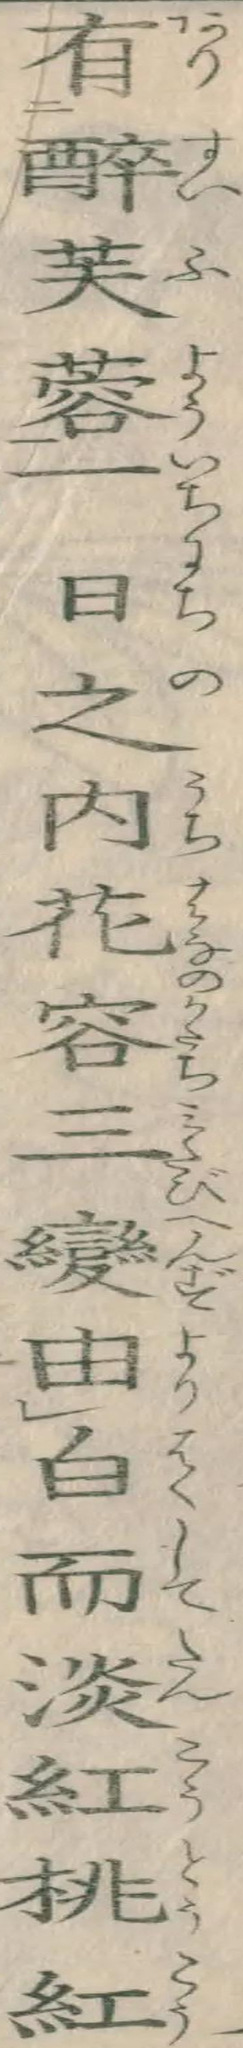有酔芙蓉一日之内花容三変由白而淡紅桃紅
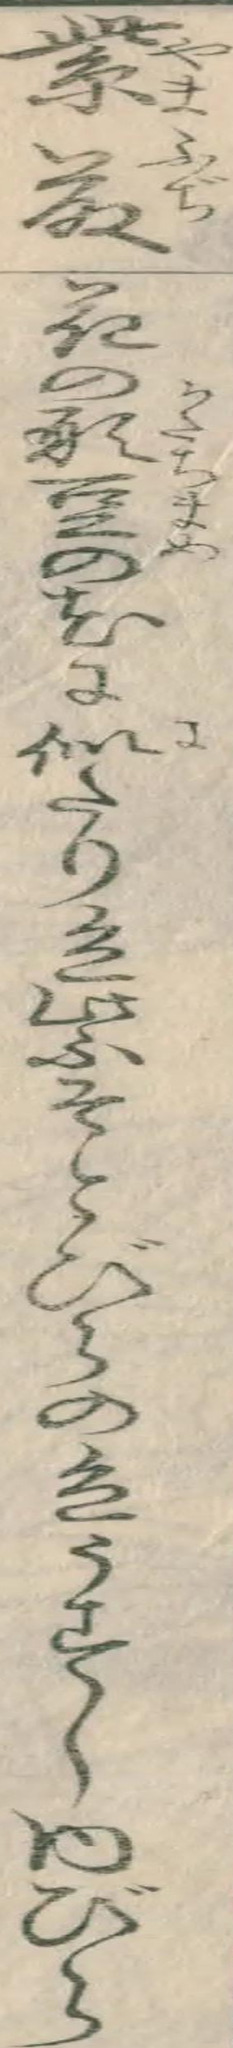[紫藤]花の形豆の花に似たり色紫そとびらの色うすし内びら
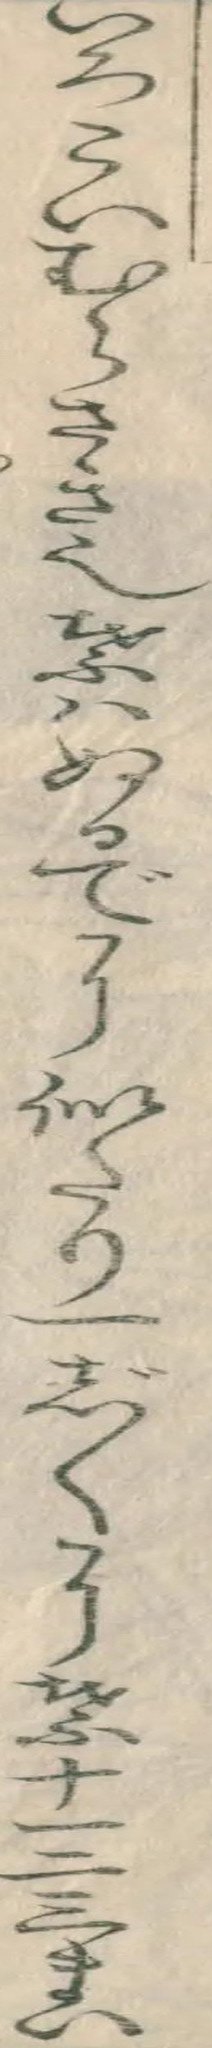いろこいむらさき也葉はぬるでに似たり一じくに葉十一二三まい
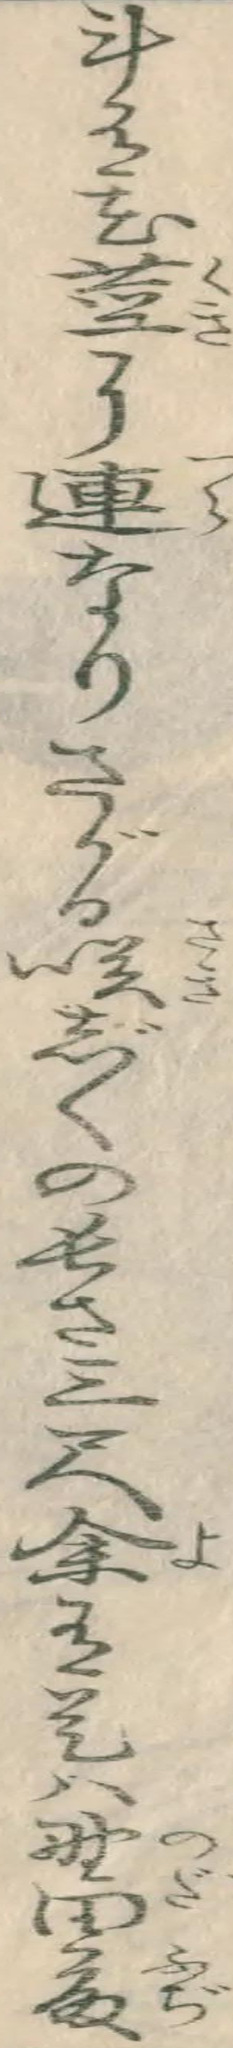斗有花茎に連なりさがる咲じくの長さ三尺余有是は野田藤
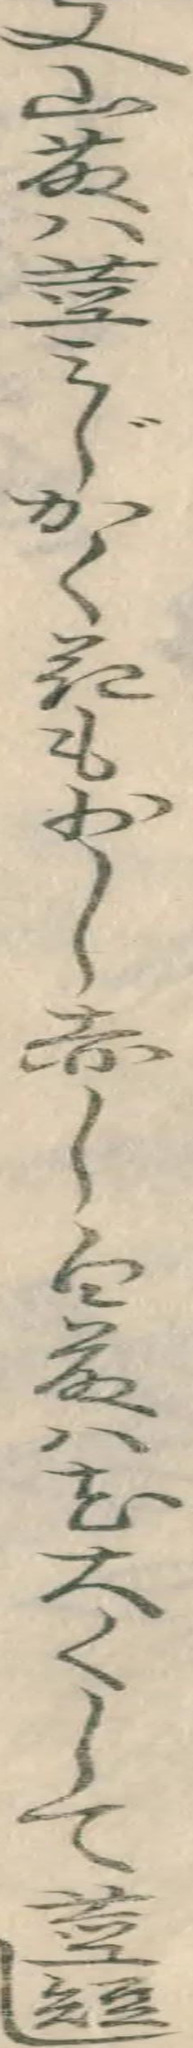又山藤は茎みじかく花も少し赤し白藤は花大くして茎短し
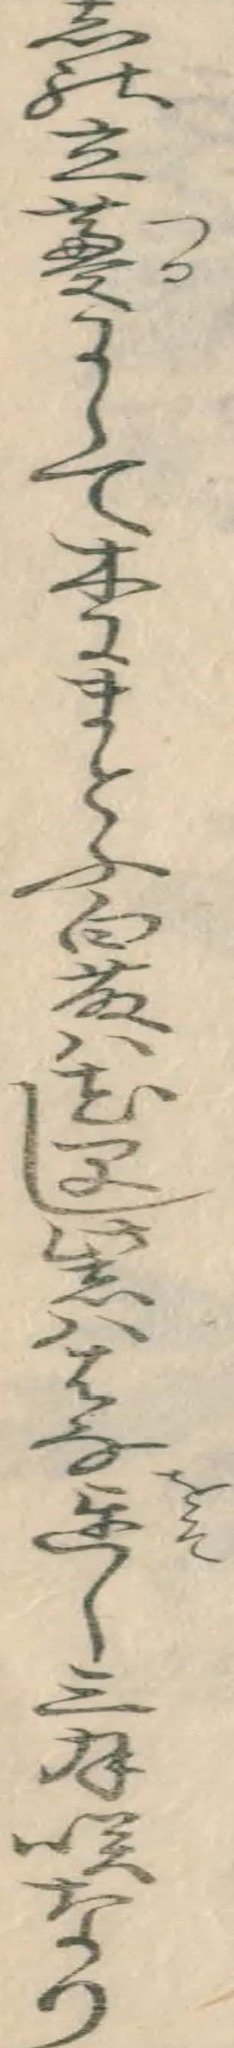しの立蔓にして木にまとふ白藤は花早し紫ははな遅し三月咲なり

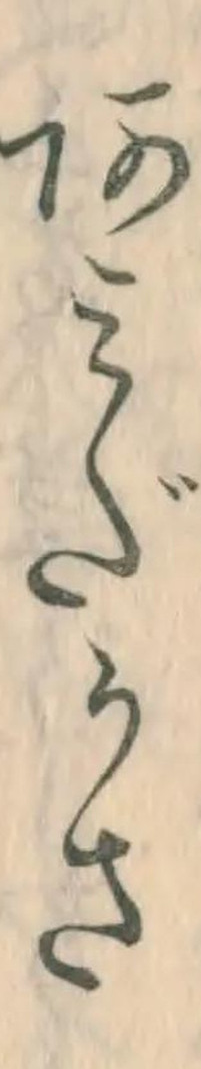あみだかさ
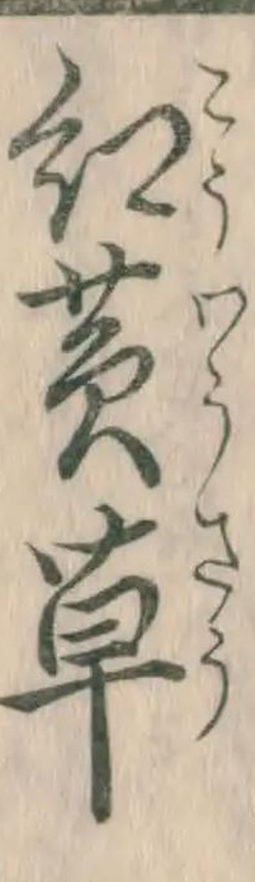紅黄草
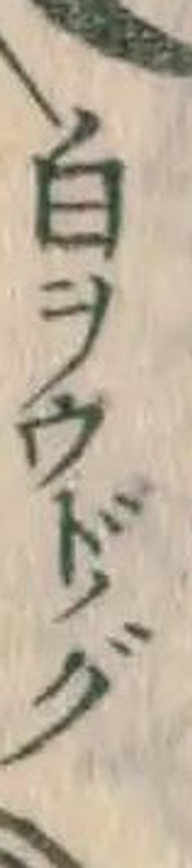白ヲウドノグ
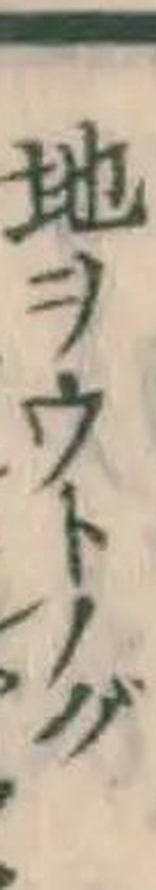白ヲウドノグ
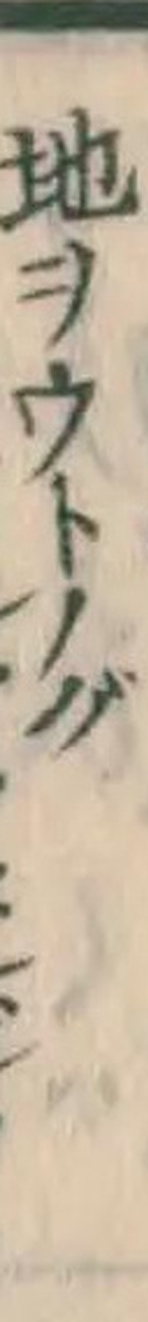白ヲウドノグ
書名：畫本野山草. [1]
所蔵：国立国会図書館 National Diet Library, JAPAN
